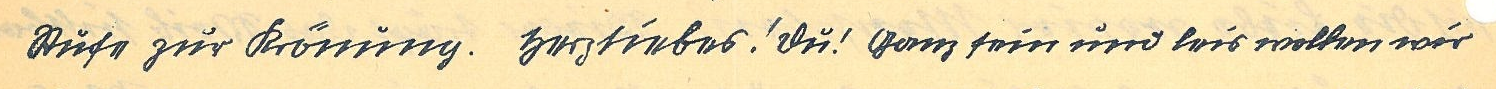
Stufe zur Krönung. Herzliebes! Du! Ganz fein und leis wollen wir
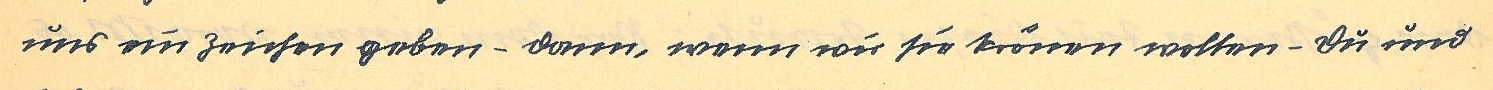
uns ein Zeichen geben – dann, wenn wir sie krönen wollen – Du und
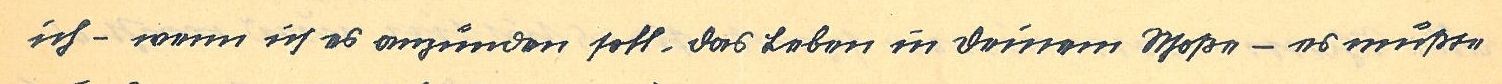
ich – wenn ich es anzünden soll, das Leben in Deinem Schoße – es müßte
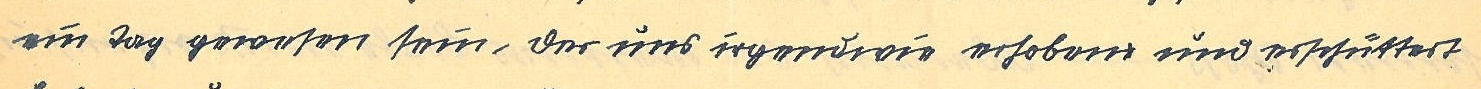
ein Tag gewesen sein, der uns irgendwie so erhoben und erschüttert
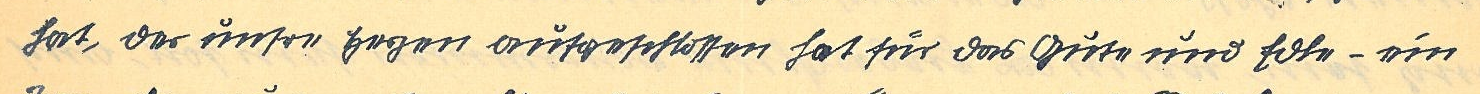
hat, der unsre Herzen aufgeschlossen hat für das Gute und Edle – ein
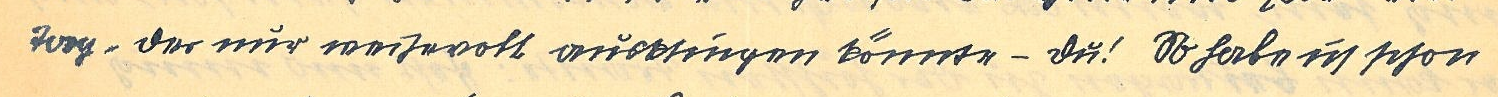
Tag, der nur weihevoll ausklingen könnte – Du! So habe ich schon
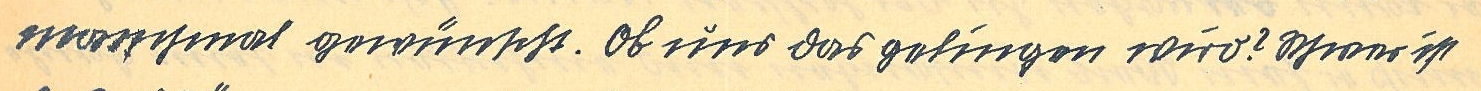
manchmal gewünscht. Ob uns das gelingen wird? Schwer ist
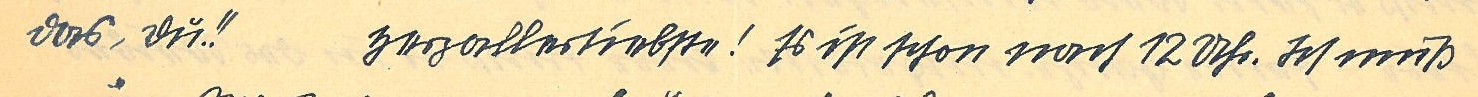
das, Du!! Herzallerliebste! Es ist schon nach 12 Uhr. Ich muß
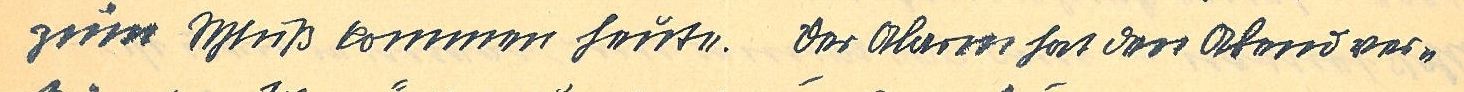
zum Schluß kommen heute. Der Alarm hat den Abend ver¬
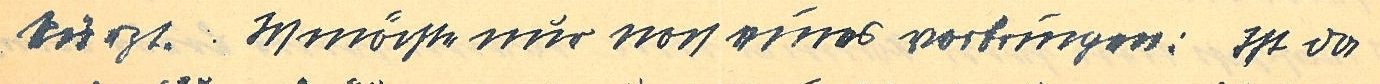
kürzt. Ich möchte nur noch eines vorbringen: Ist da
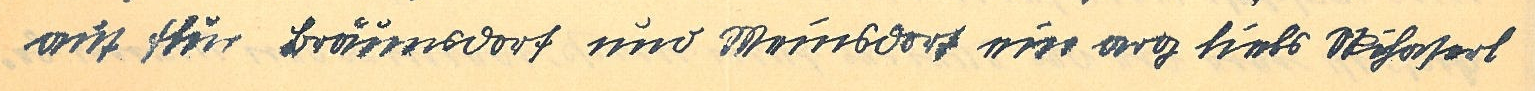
auf Flur B. und M. ein arg liebs Skihaserl
